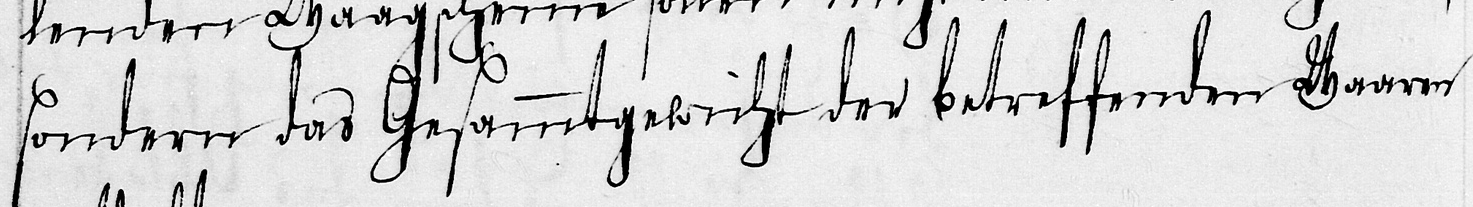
sondern das Gesammtgewicht der betreffenden Waaren
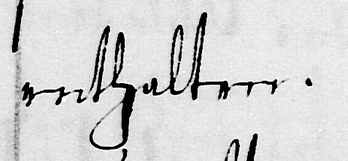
enthalten.
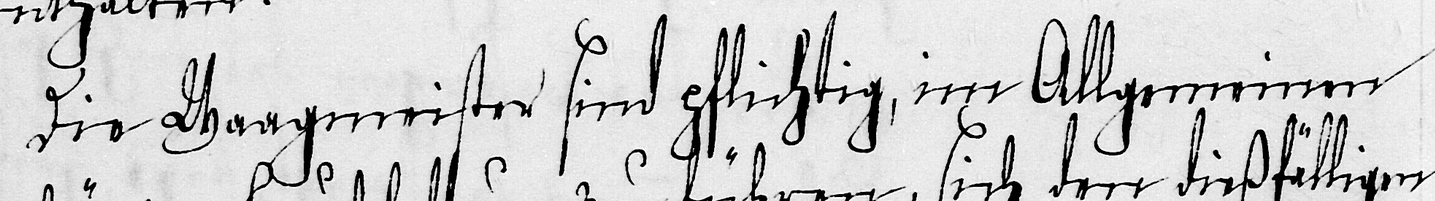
Die Waagmeister sind pflichtig, im Allgemeinen
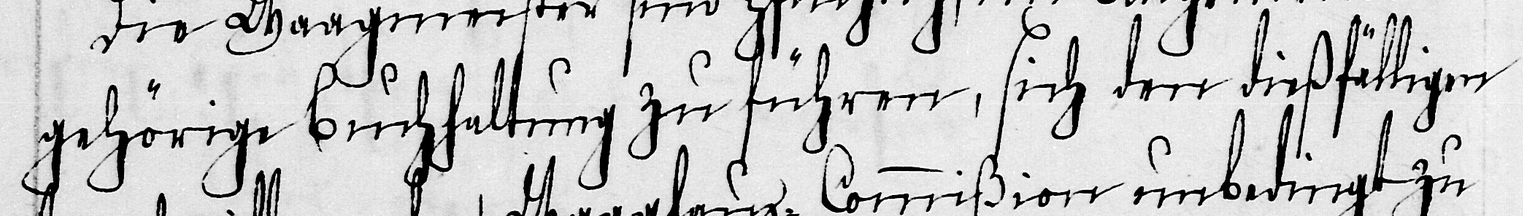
gehörige Buchhaltung zu führen, sich den dießfälligen
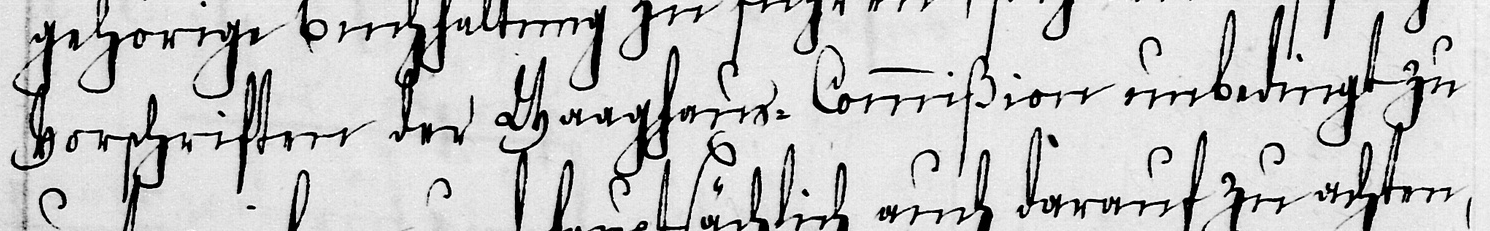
Vorschriften der Waaghaus-Commißion unbedingt zu
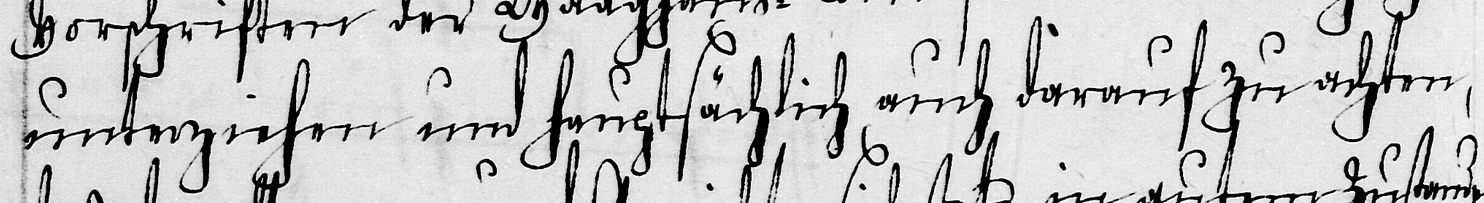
unterziehen und hauptsächlich auch darauf zu achten,
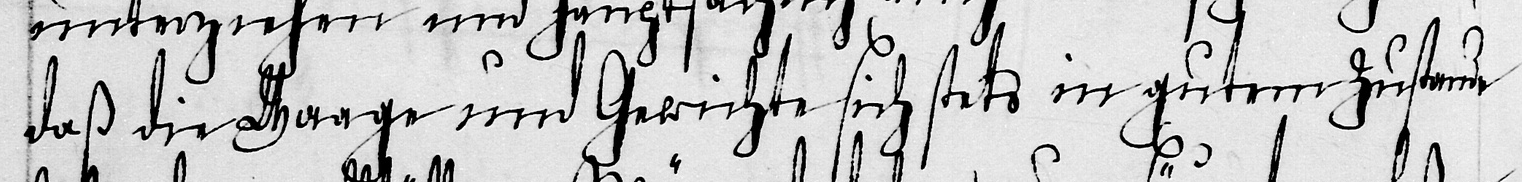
daß die Waage und Gewichte sich stets in gutem Zustande
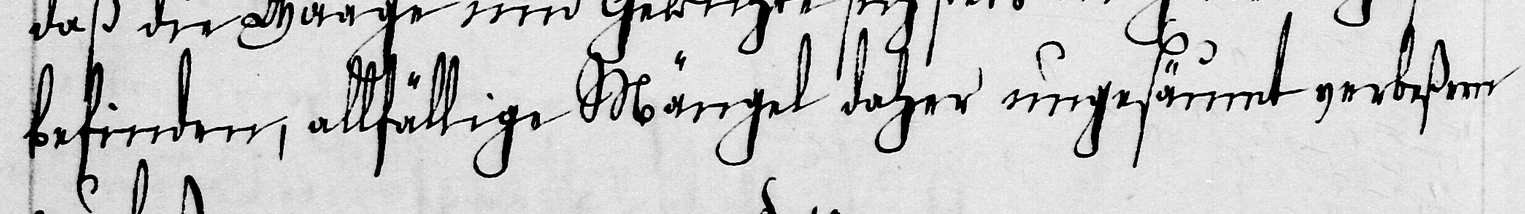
befinden, allfällige Mängel daher ungesäumt verbeßern
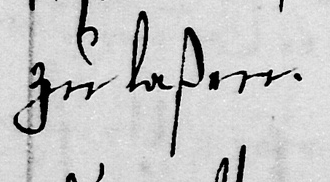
zu laßen.
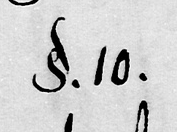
§. 10.
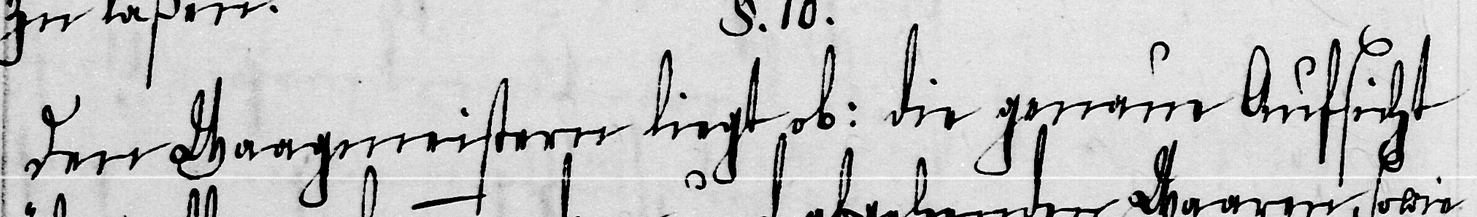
Den Waagmeistern liegt ob: die genaue Aufsicht
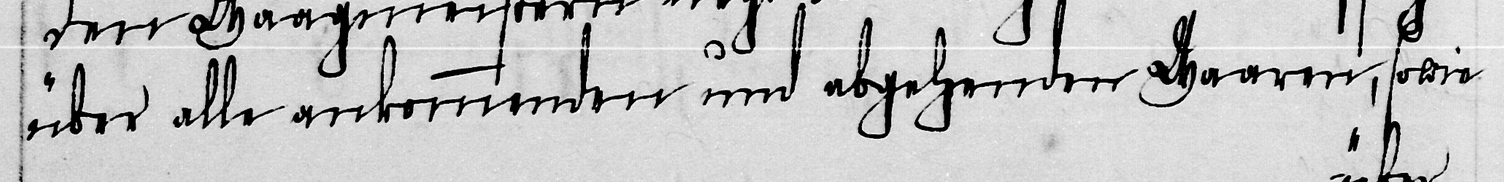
über alle ankommenden und abgehenden Waaren, sowie
